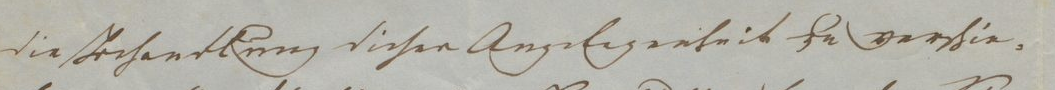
die Behandlung dieser Angelegenheit zu verschie-
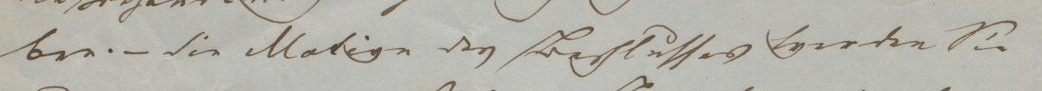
ben. – Die Motive des Beschlusses werden Sie
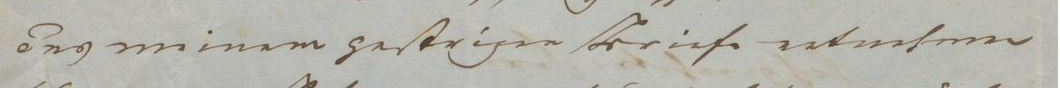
aus meinem gestrigen Briefe entnehmen
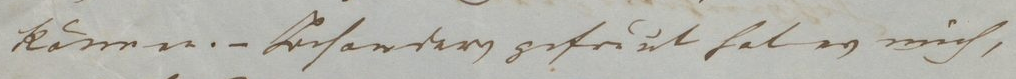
können. – Besonders gefreut hat es mich,
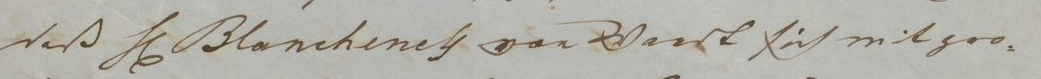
daß Herr Blancheney von Waadt sich mit gro-
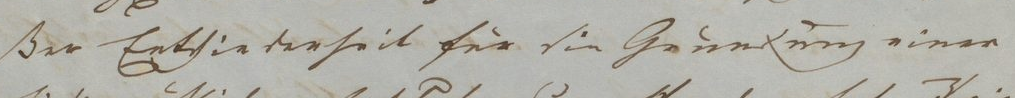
ßer Entschiedenheit für die Gründung einer
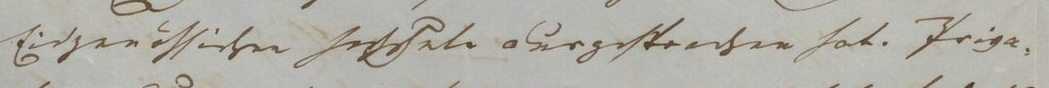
Eidgenössischen Hochschule ausgesprochen hat. Priva-
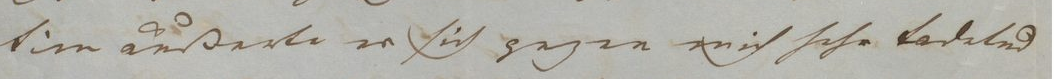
tim äußerte er sich gegen mich sehr tadelnd
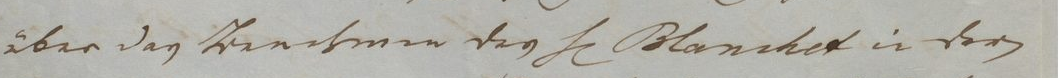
über das Benehmen des Herrn Blanchet in der
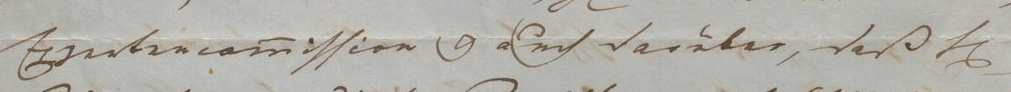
Expertencommission & auch darüber, daß Herr
